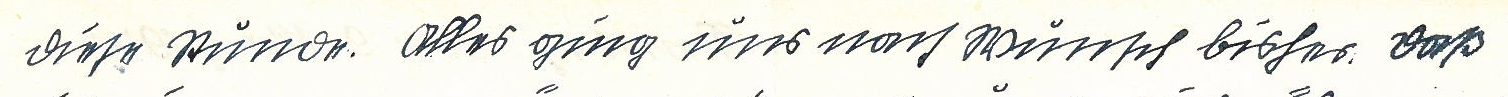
diese Stunde. Alles ging uns nach Wunsch bisher. Daß
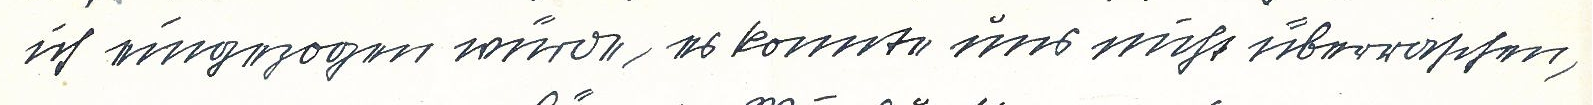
ich eingezogen würde, es konnte uns nicht überraschen,
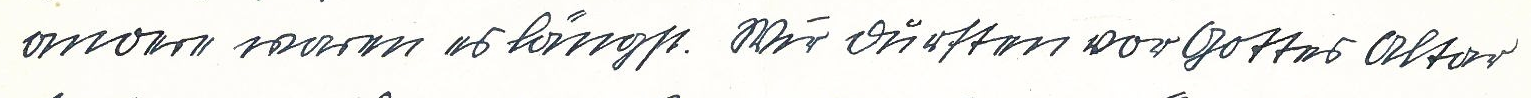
andere waren es längst. Wir durften vor Gottes Altar
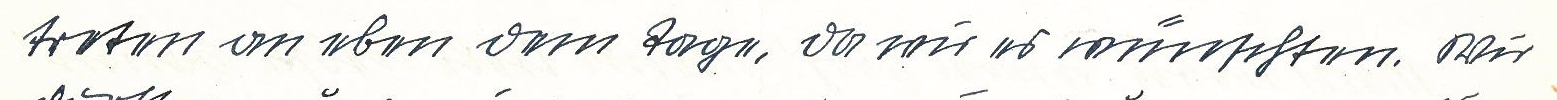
treten an eben dem Tage, da wir es wünschten. Wir
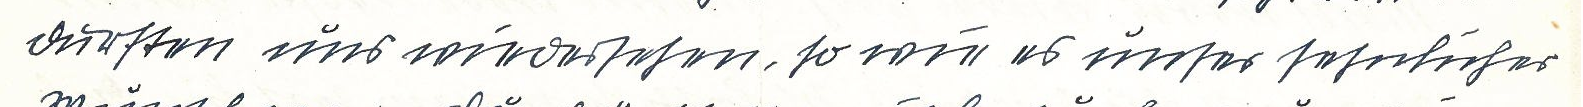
durften uns wiedersehen, so wie es unser sehnlicher
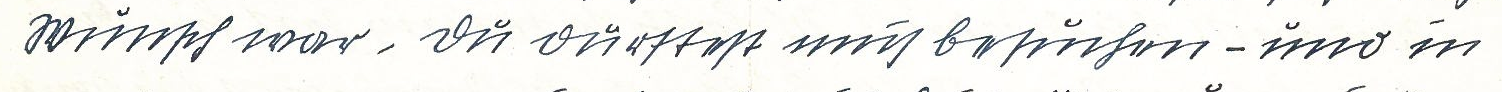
Wunsch war – Du durftest mich besuchen – und in
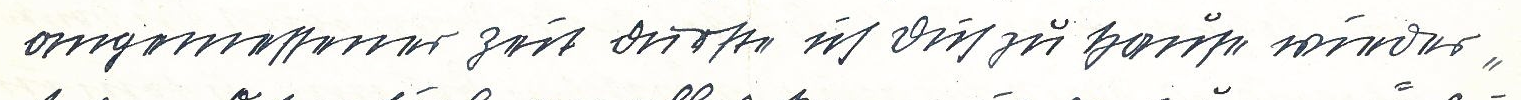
angemessener Zeit durfte ich Dich zu Hause wieder
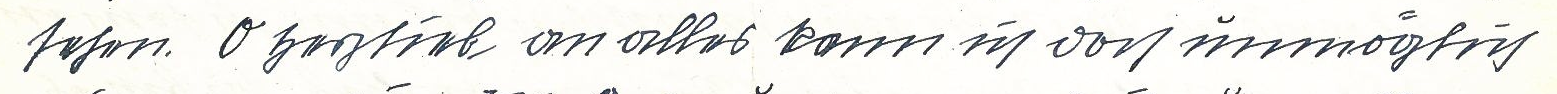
sehen. O Herzlieb, an alles kann ich doch unmöglich
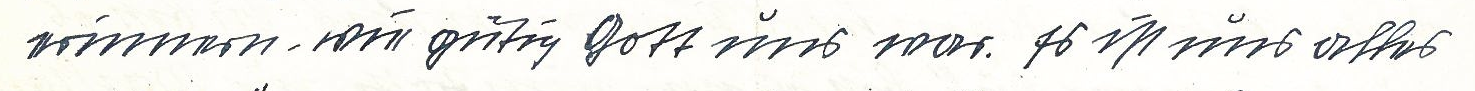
erinnern, wie gütig Gott uns war. Es ist uns alles
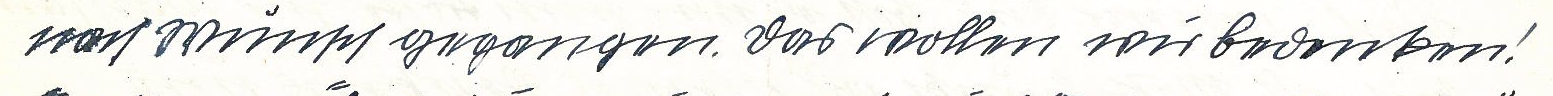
nach Wunsch gegangen. Das wollen wir bedenken!
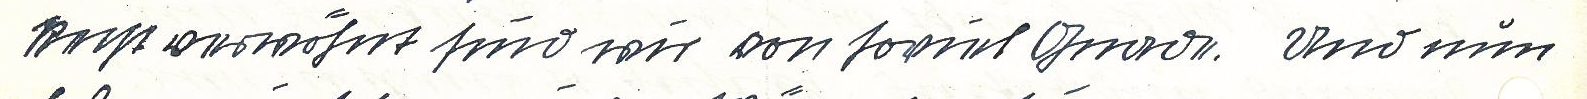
Recht verwöhnt sind wir von so viel Gnade. Und nun
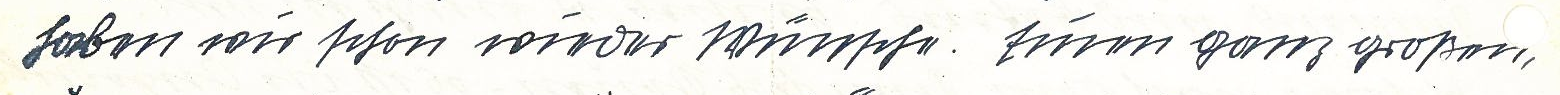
haben wir schon wieder Wünsche. Einen ganz großen,
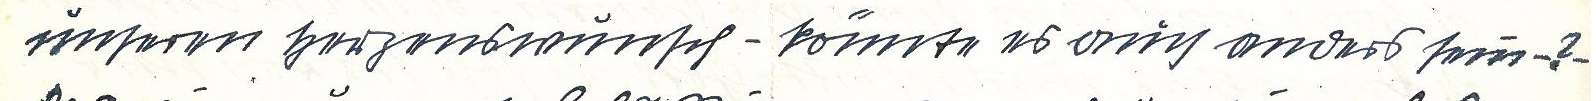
unseren Herzenswunsch – könnte es auch anders sein – ? –
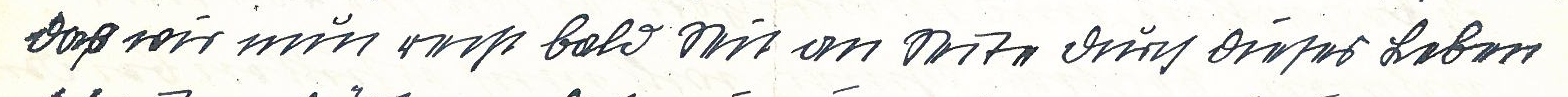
daß wir nun recht bald Seit an Seite durch dieses Leben
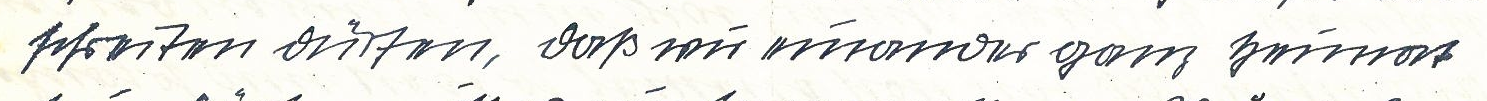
schreiten dürfen, daß wir einander ganz Heimat
